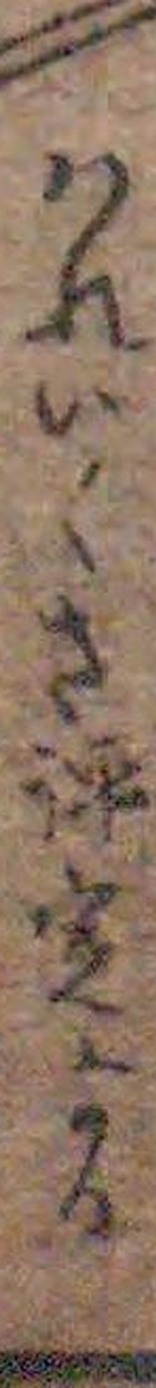はれいくさ評定する

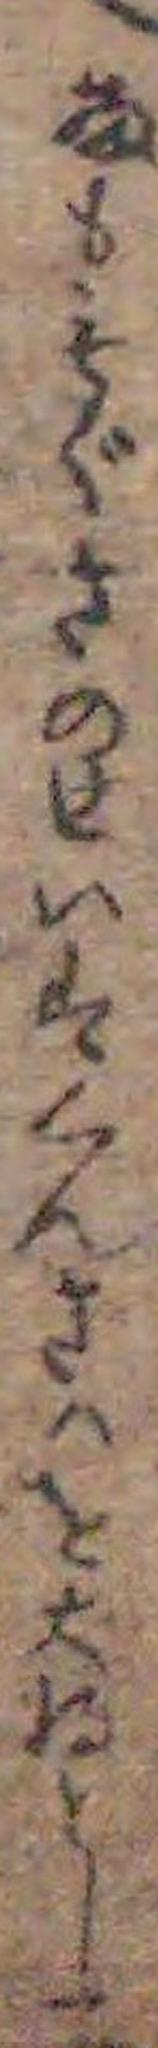扨ももぐさのせいはくんさいを大将として
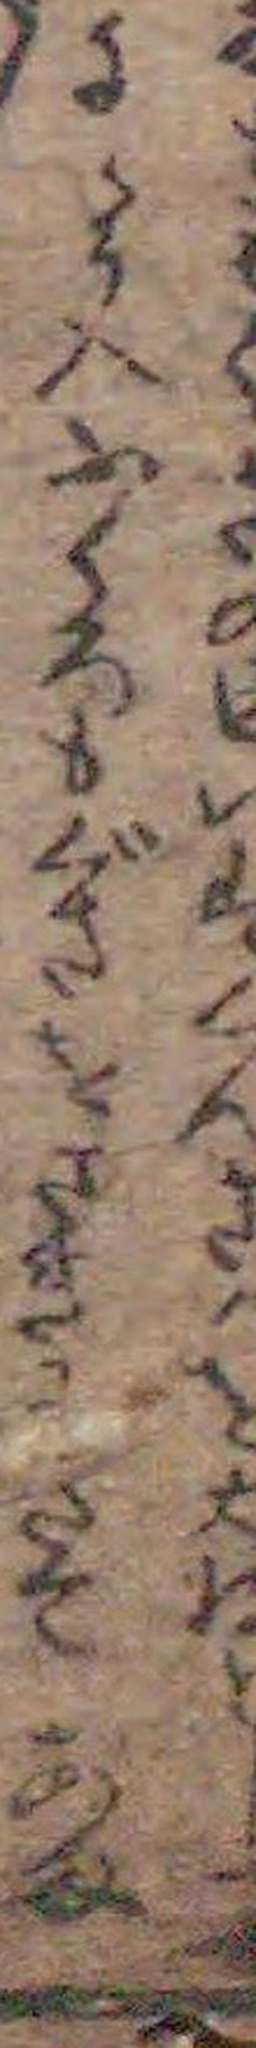千う入ふくろもぐさをさきにたてあま
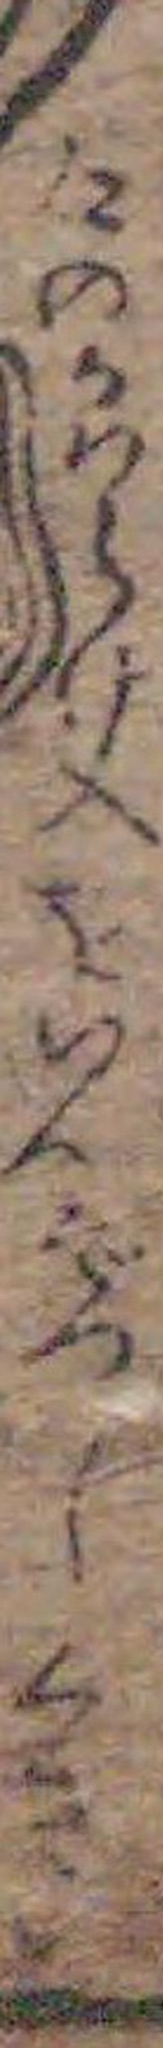にのかはらけ入をいんぞつしくさ
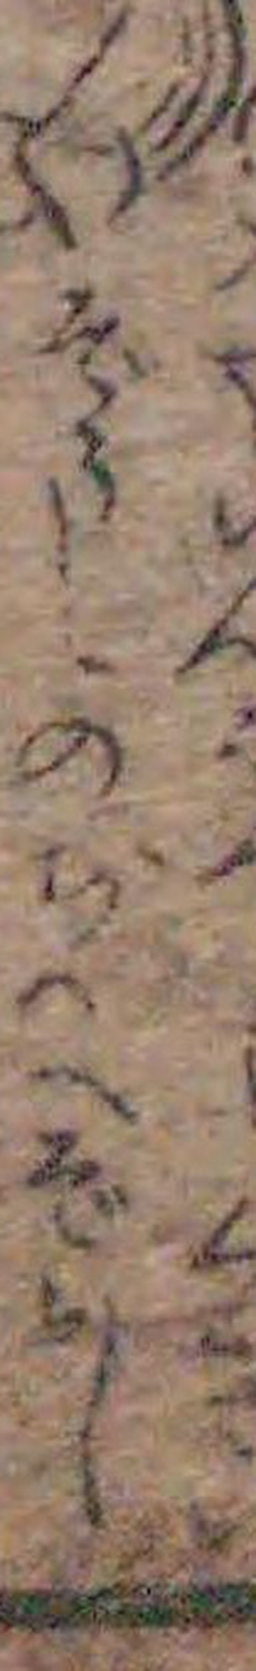ぞうしのぢんへぞおし
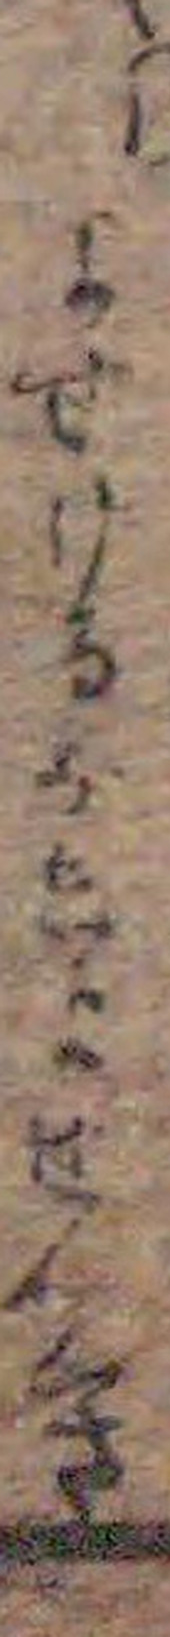よせけるがしよせんくさ
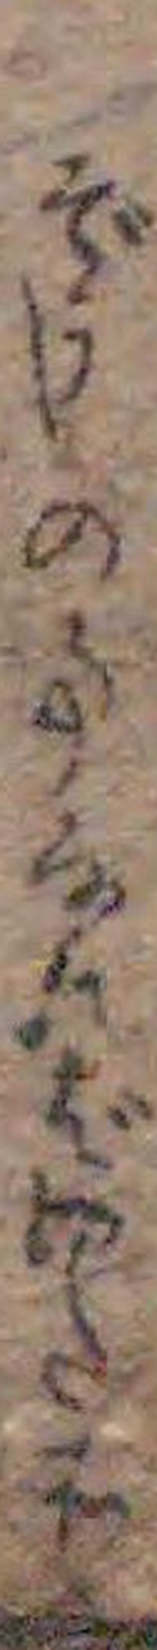ぞうしの事なれば切た所
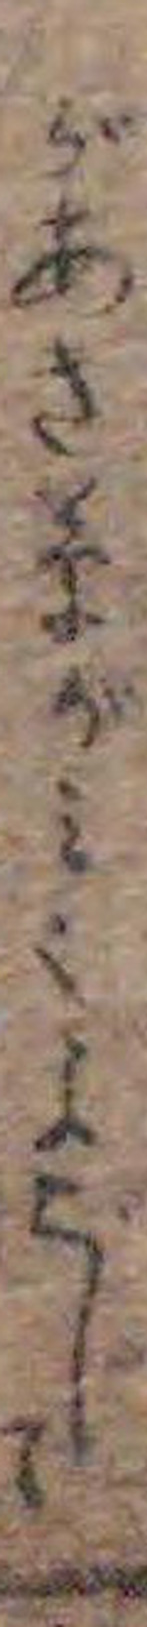があさ草がみ也よごして
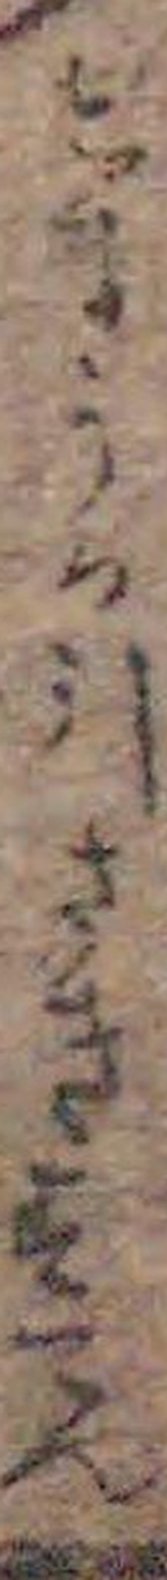しまうか引さきすてん
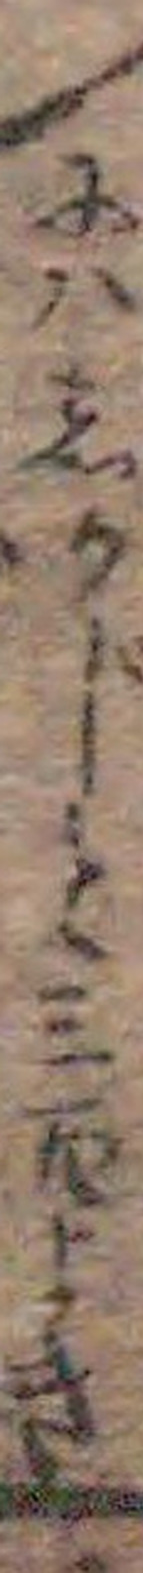にはしかじと三百よき
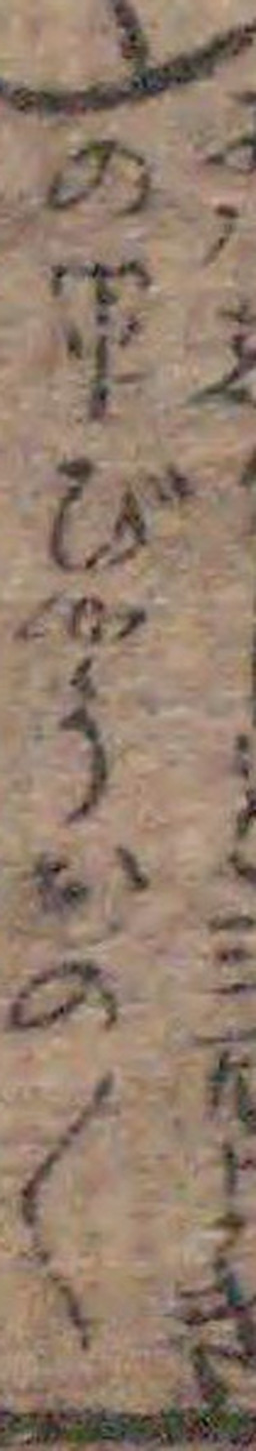の軍びやうおの〳〵
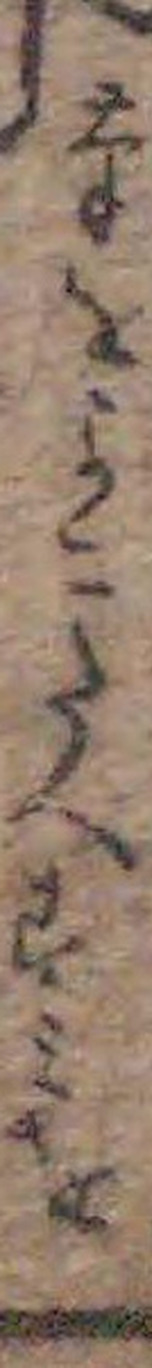筆をよこたへすみを
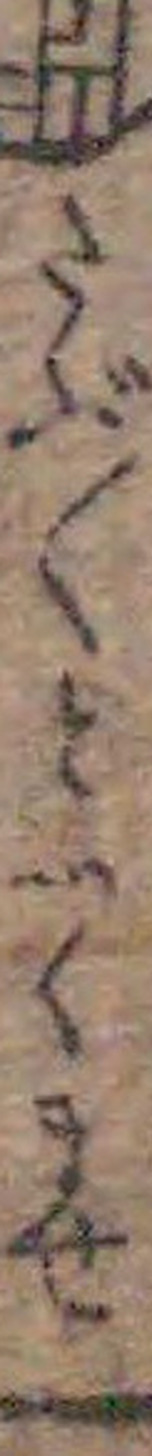たぶ〳〵とふくませ
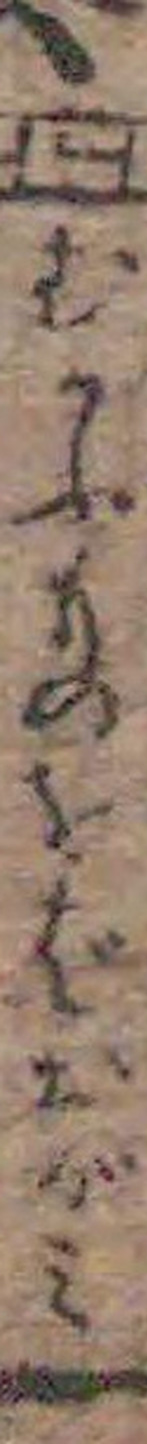むかふものをばおがみ
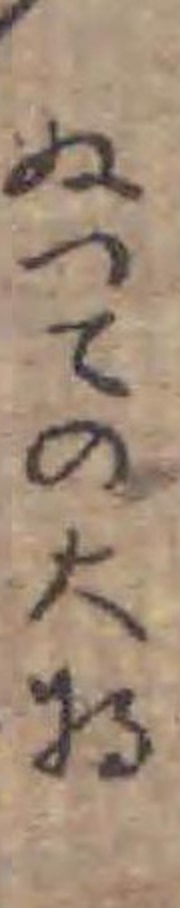ぬつての大将
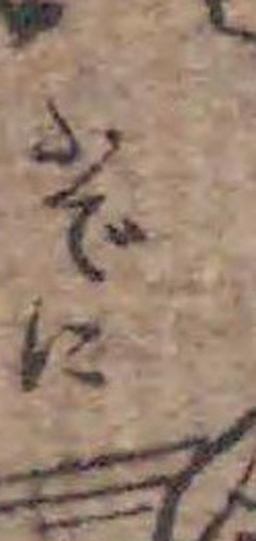ふでに
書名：三舛増鱗組 : 3巻
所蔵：国立国会図書館 National Diet Library, JAPAN
